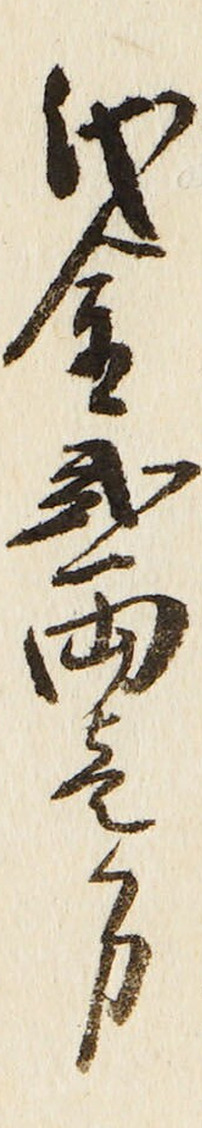代金弐両壱分
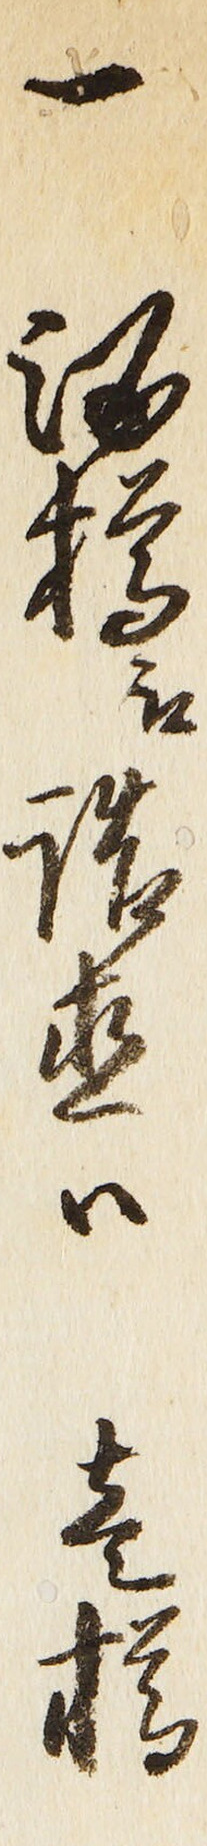一酒樽江詰直ハ壱樽
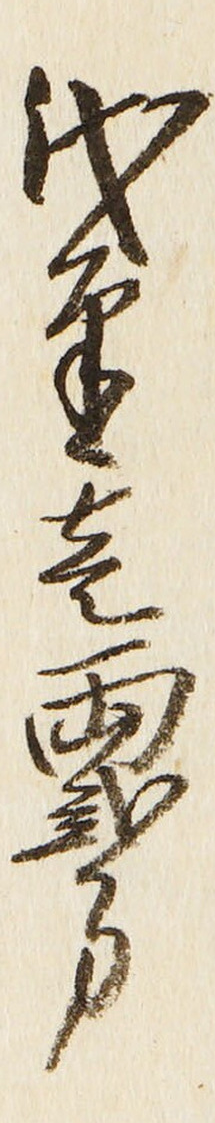代金壱両弐分
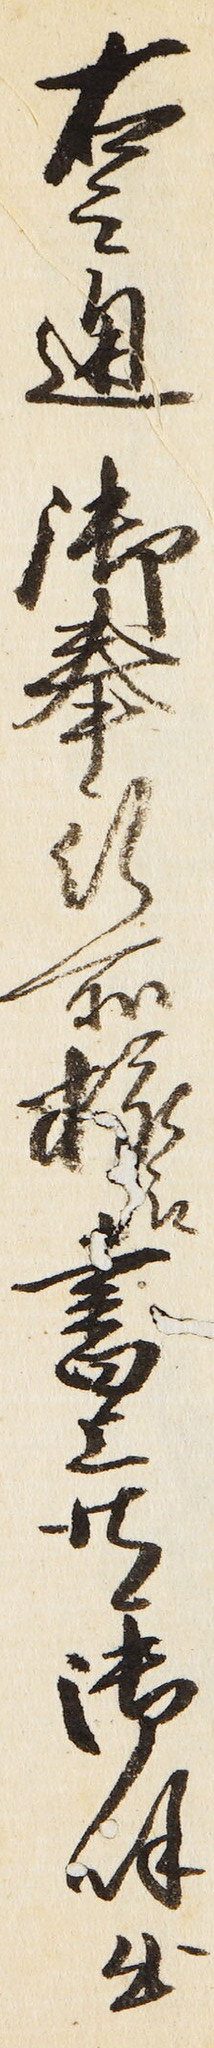右之通御奉行所様江書上仕候御呼出
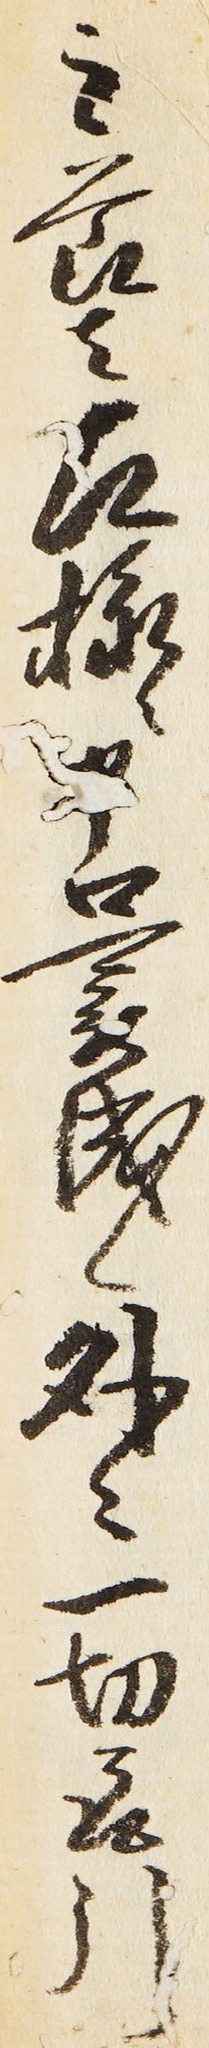之節者左様ニ申口被成候外ニ一切取引
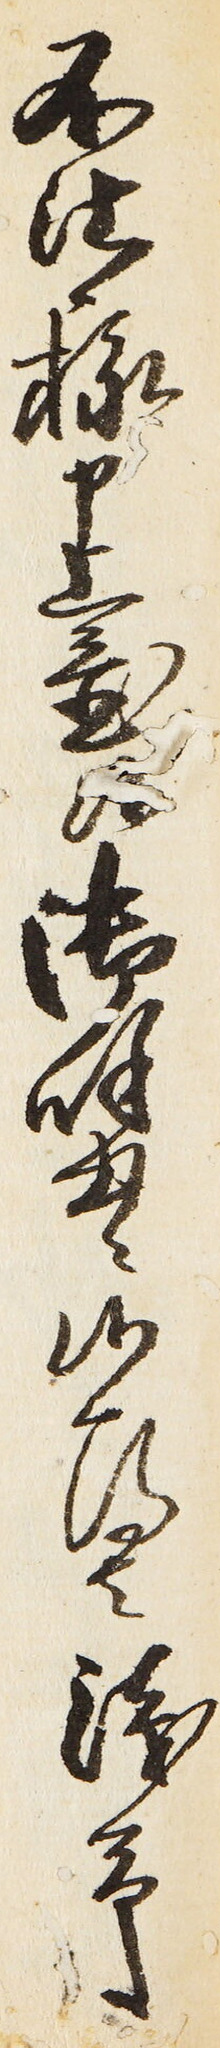不仕候様申上置候御呼出ニ候得者浅草
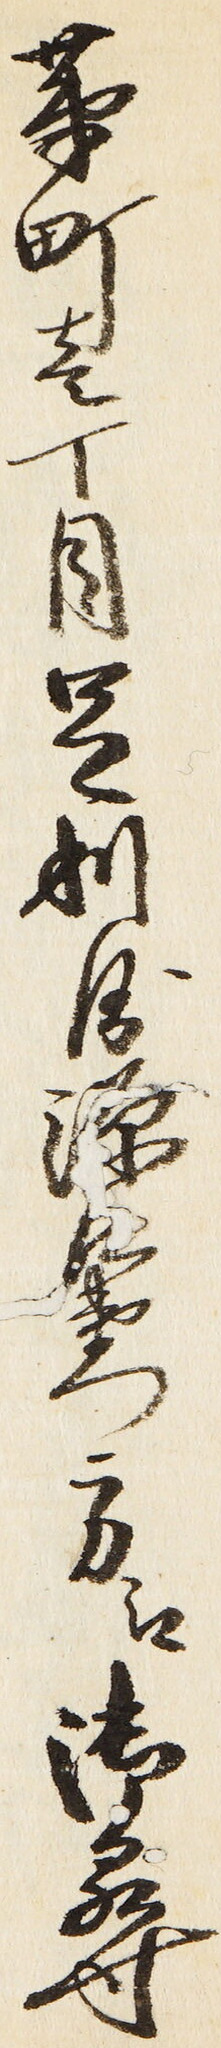茅町壱丁目足利屋源左衛門方江御尋
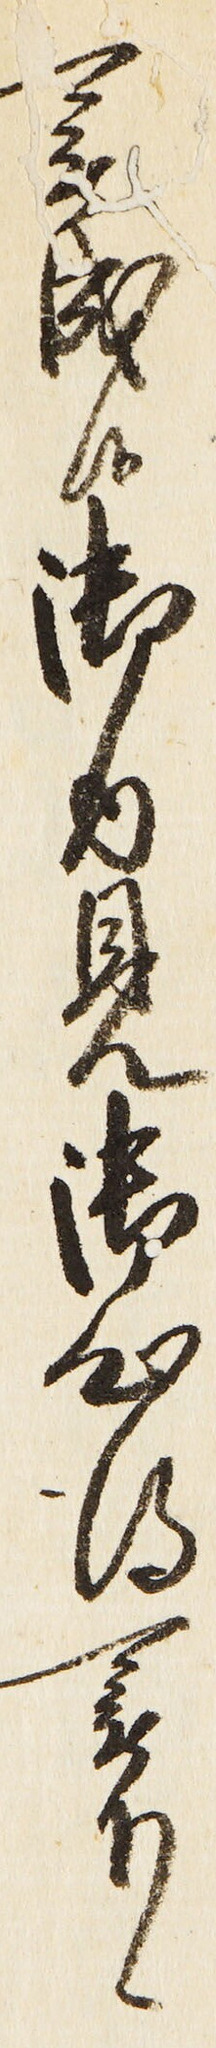可被成候御内見御心得可被下候
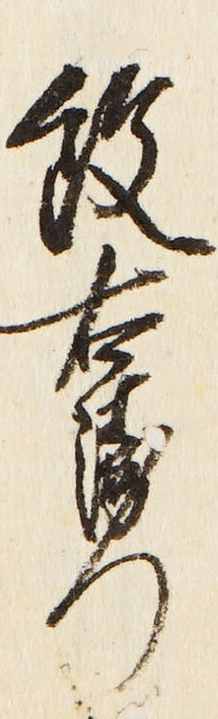政右衛門
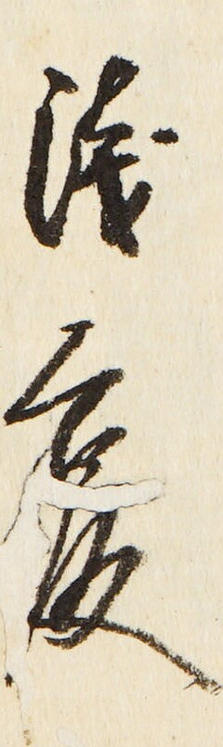浅吉殿

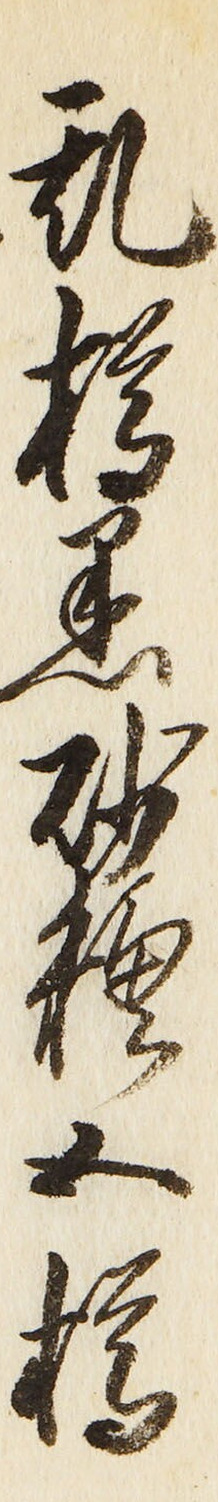一乱樽黒砂糖五樽
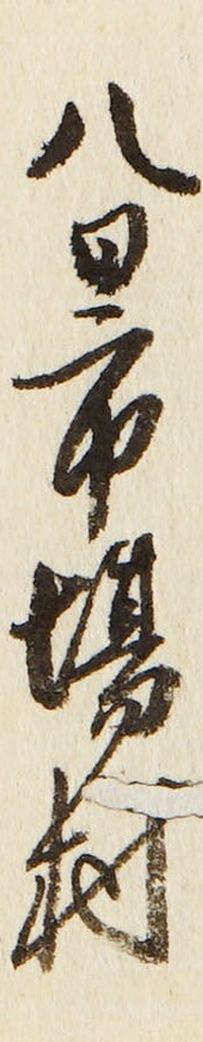八日市場村
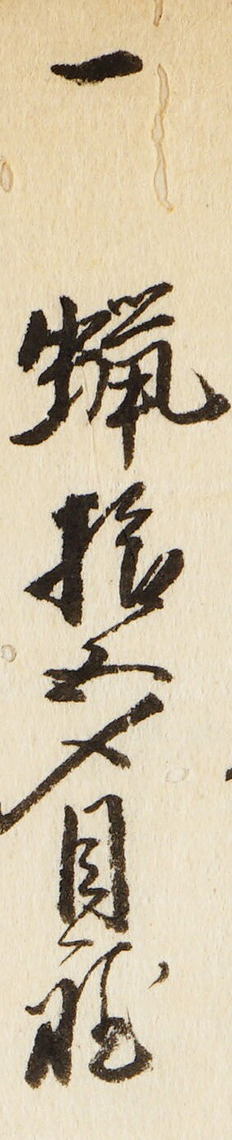一蝋拾五貫目程
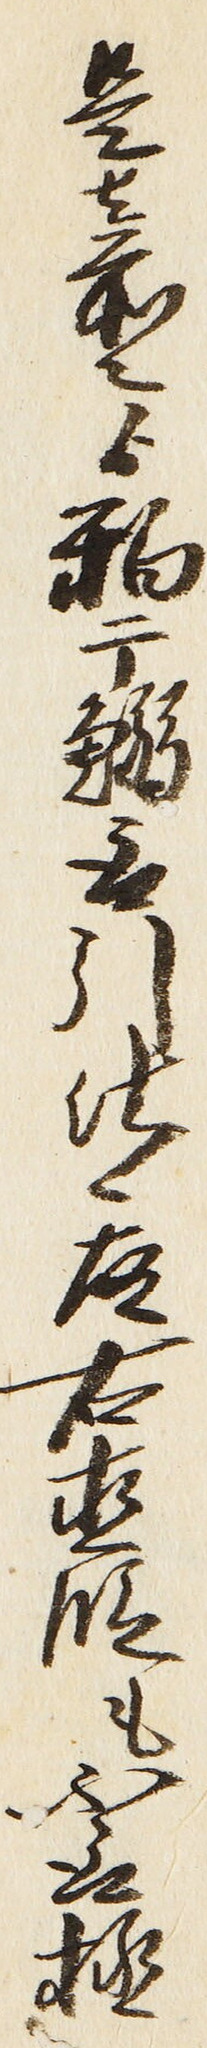是者前々ゟ粕干鰯取引仕候故右直段も不取極
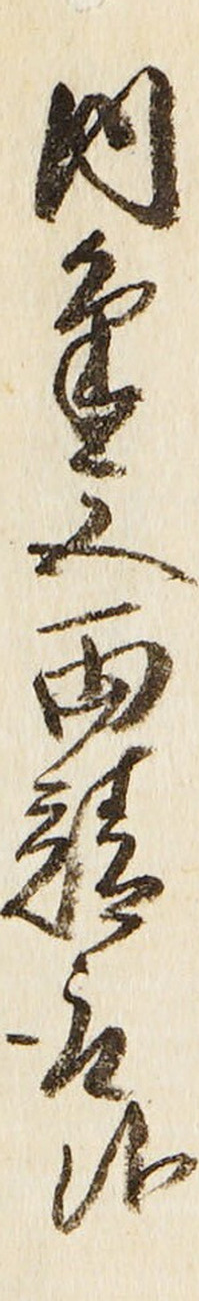内金五両請取候
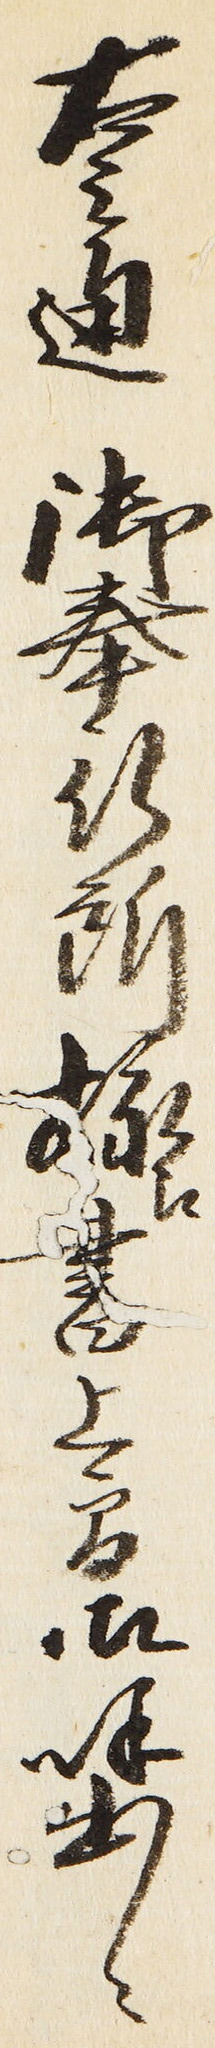右之通御奉行所様江書上候間御呼出ニ
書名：難船一件記録
